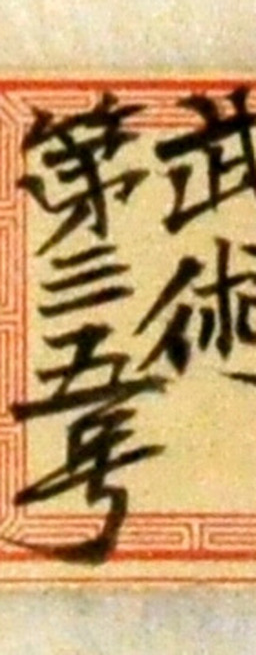第三五号

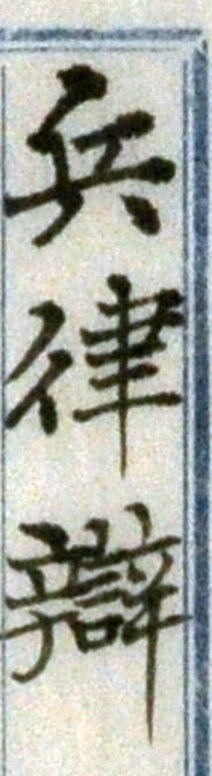兵律弁
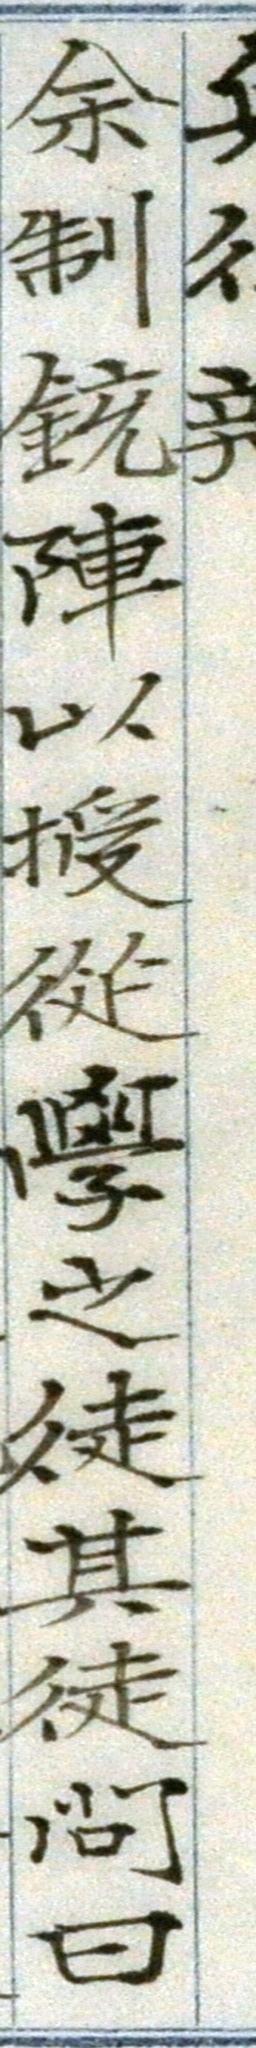余制銃陣以授従学之徒其徒問曰
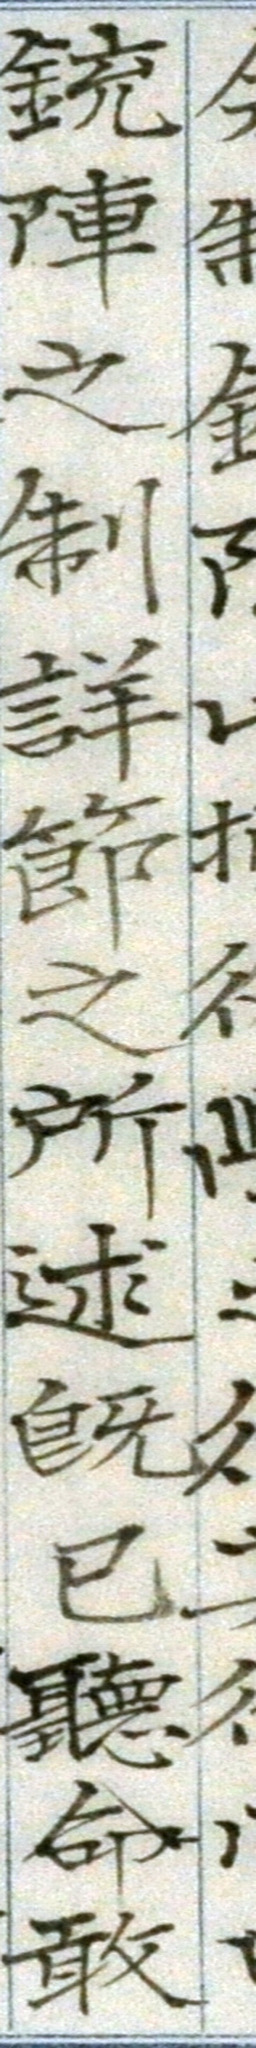銃陣之制詳節之所述既巳聴命敢
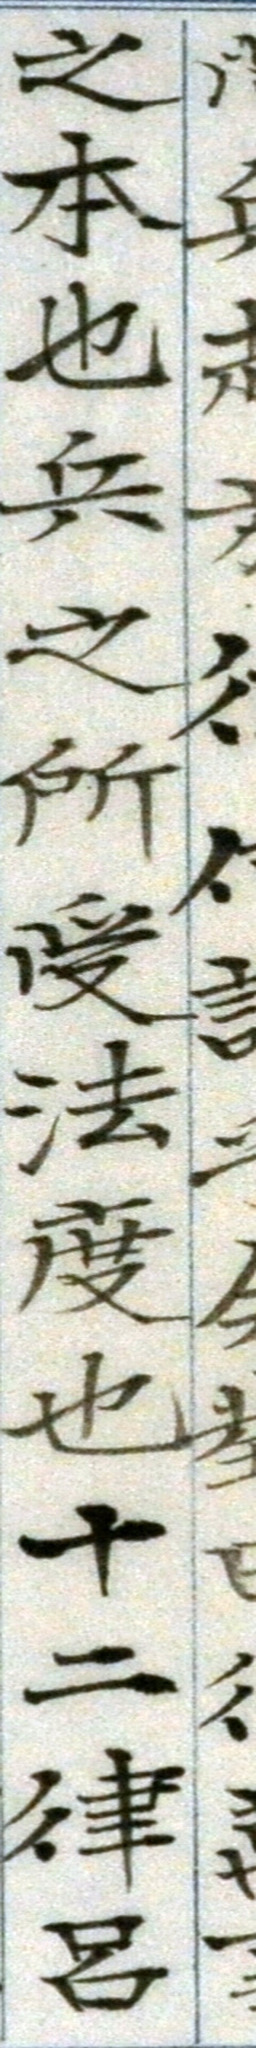之本也兵之所受法度也十二律呂
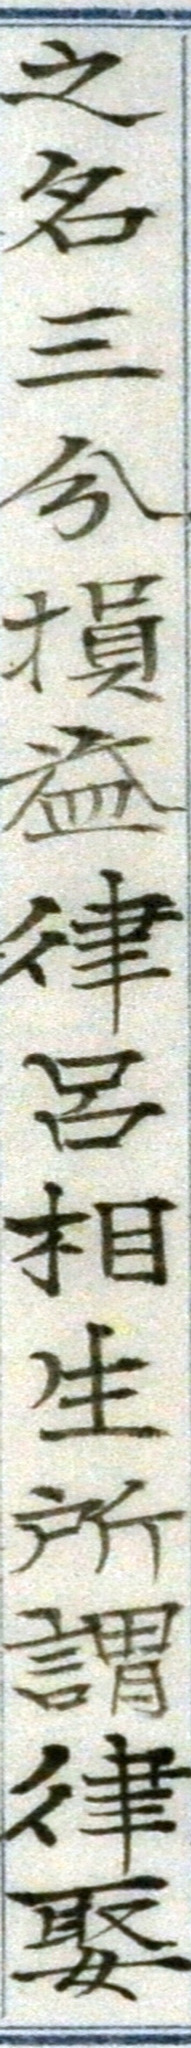之名三分損益律呂相生所謂律娶
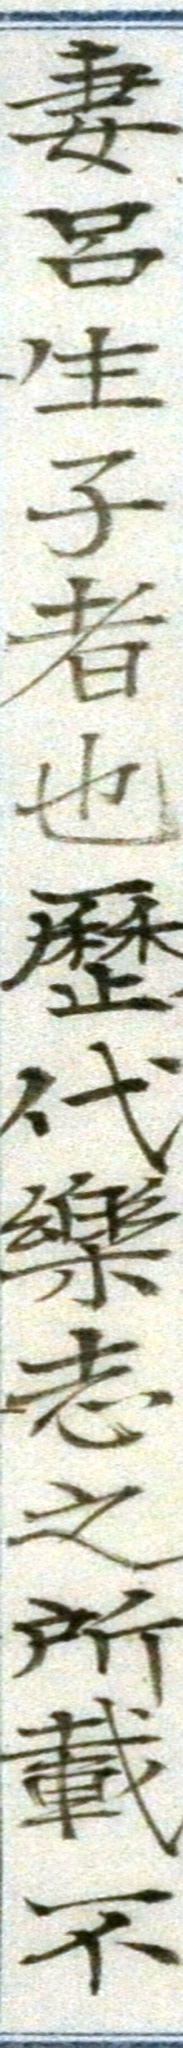妻呂生子者也歴代楽志之所載不
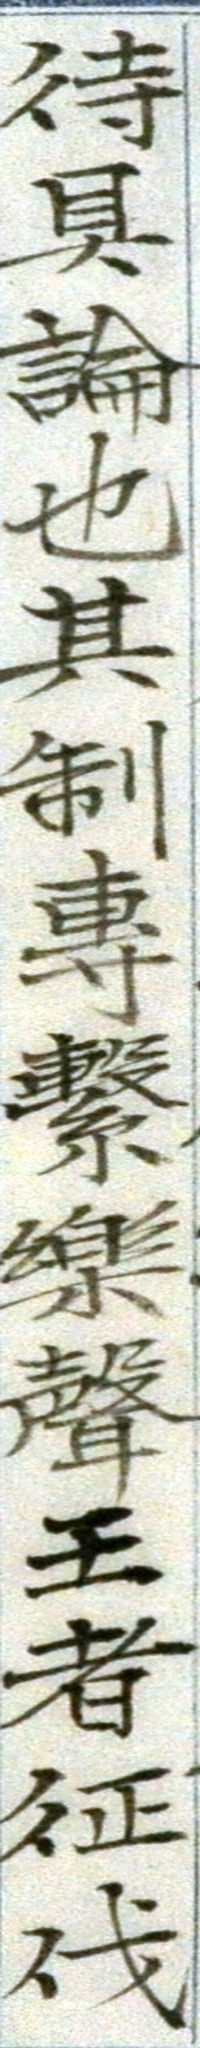待具論也其制専繋楽聲王者征伐
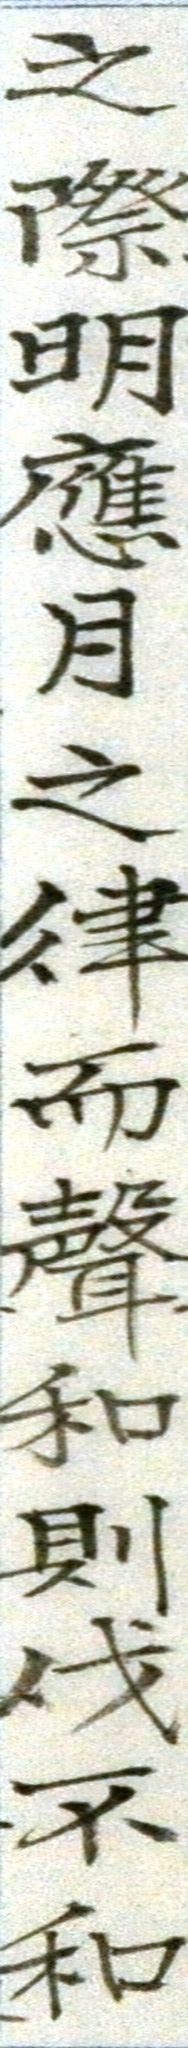之際明応月之律而聲和則伐不和
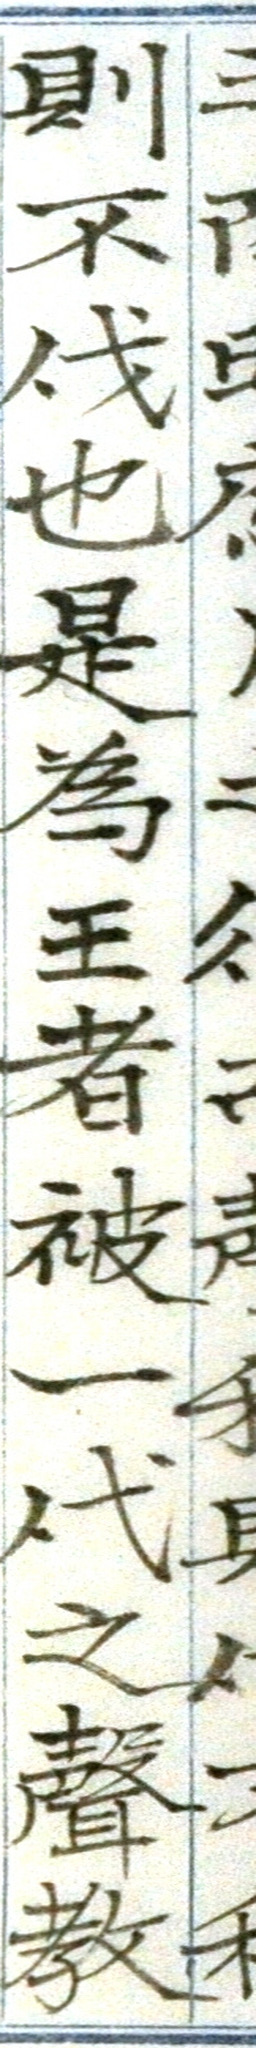則不伐也是為王者被一代之聲教

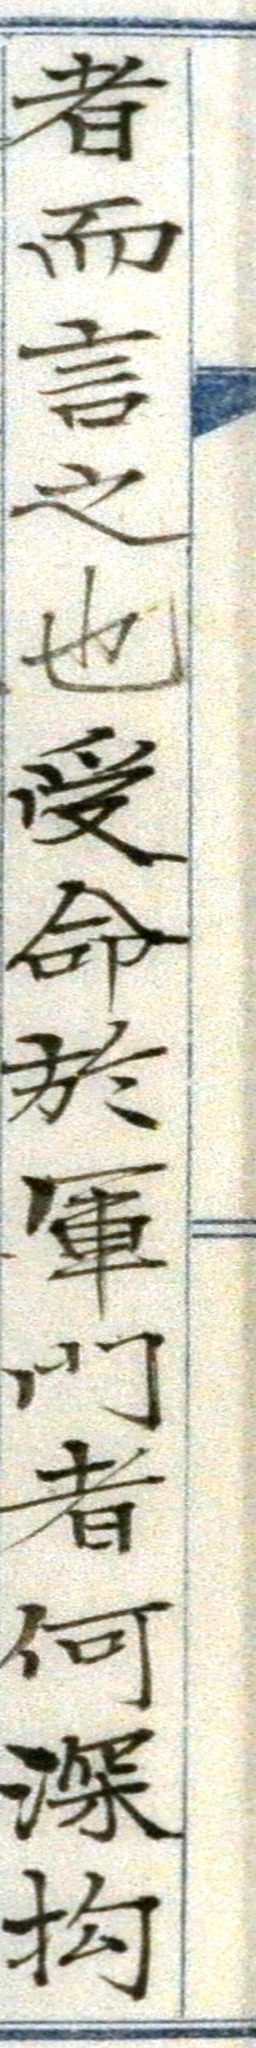者而言之也受命於軍門者何深抅
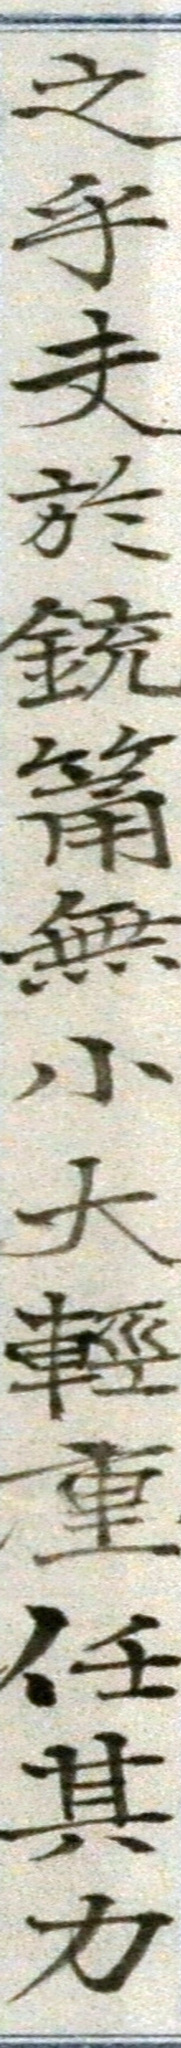之乎夫於銃箭無小大軽重任其力
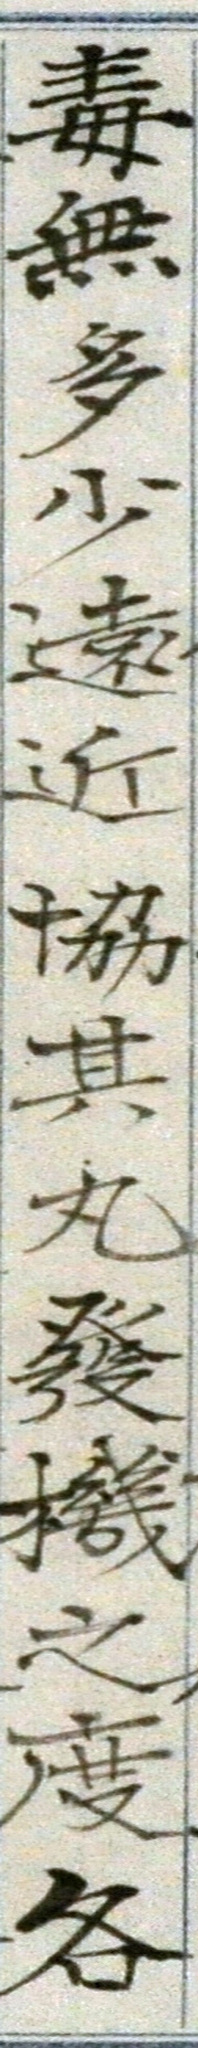毒無多少遠江協其丸発機之度各
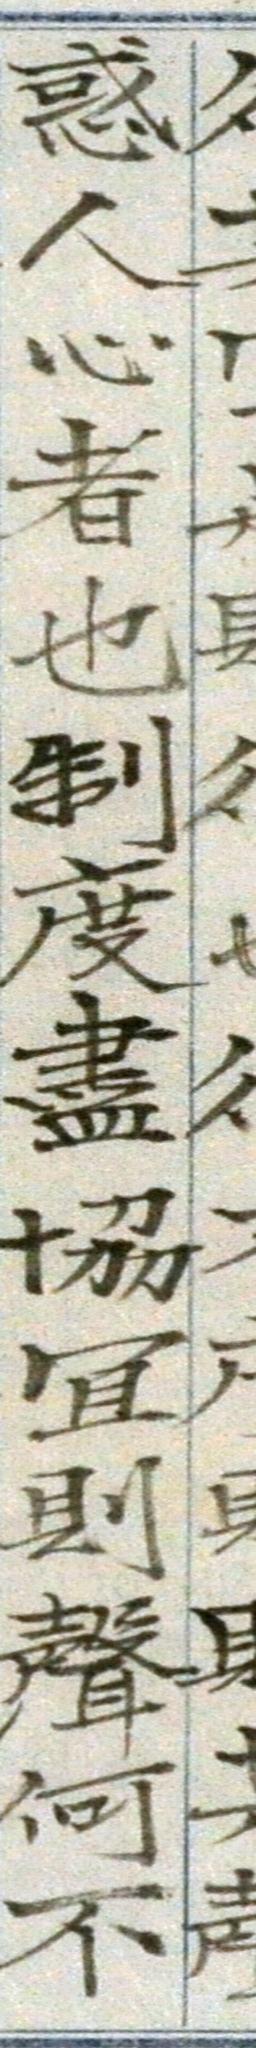惑人心者也制度尽協宜則聲何不
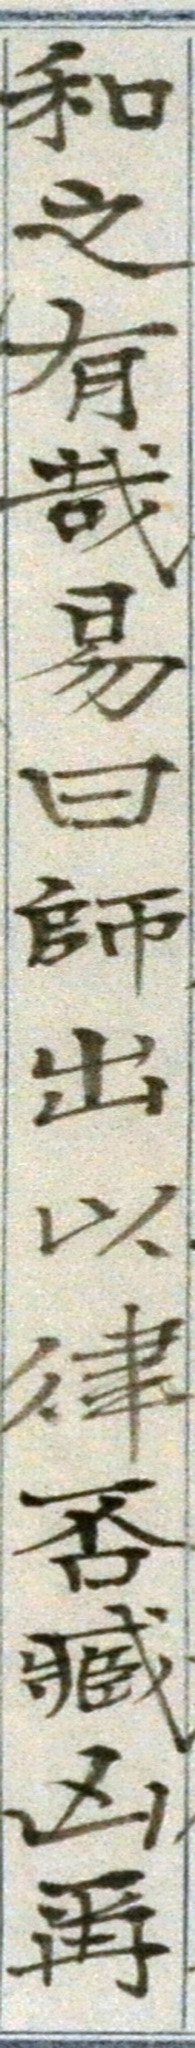和之有哉易曰師出以律否蔵凶再
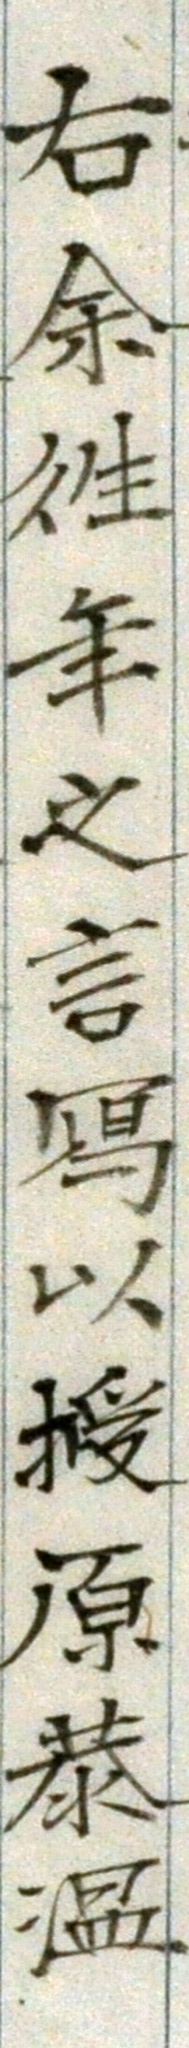右余往年之言写以授原恭温
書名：兵律辯
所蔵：伊那市立高遠町図書館・合同会社AMANE
